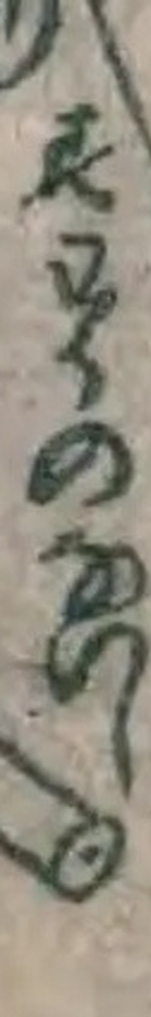すわうのないし
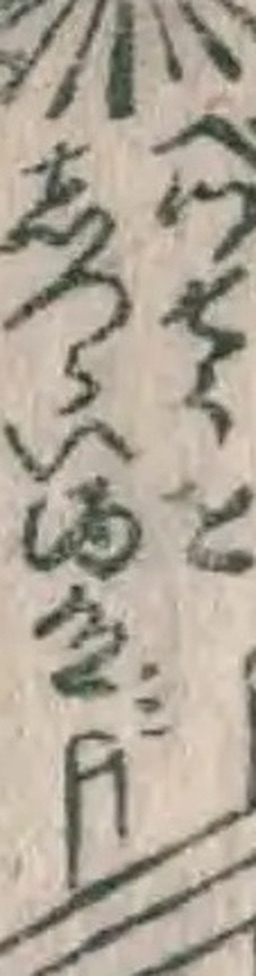しつらい酒色に
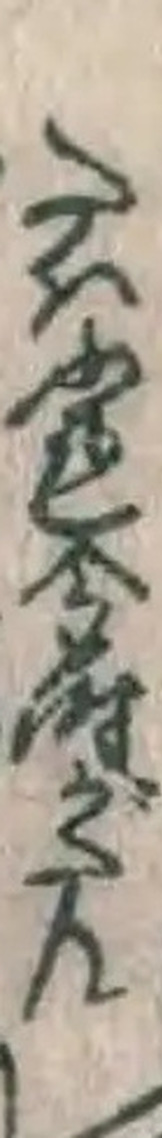たはふれ金時がたん
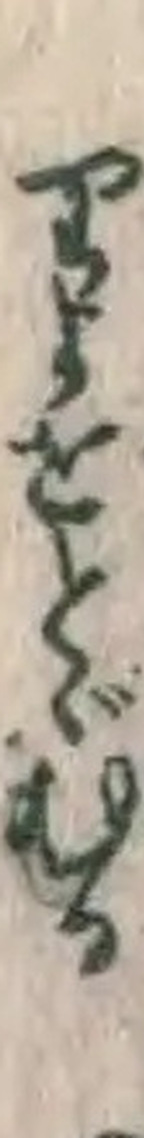りよをとゞむる
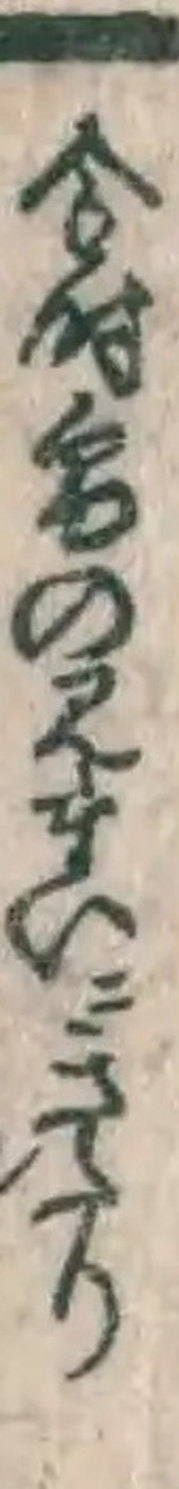金時鳥の見まいにきたり
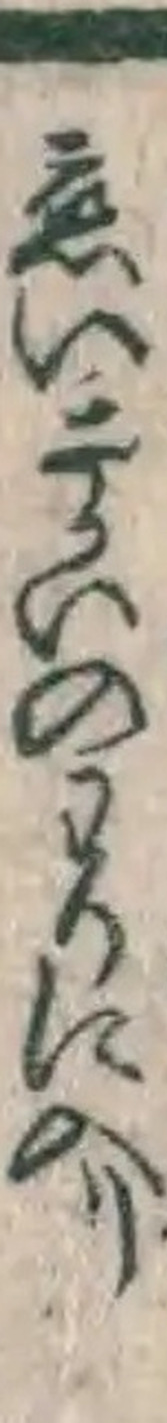恋いさかいのわりに入り
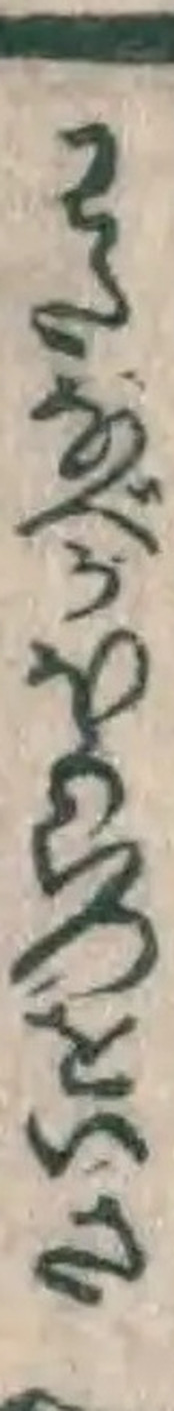わたなべかほうらつをいさ
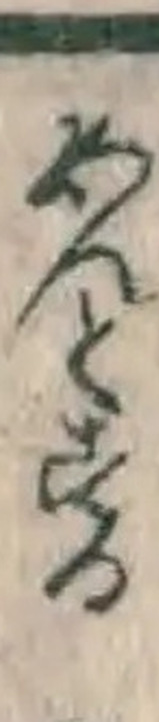めんとする
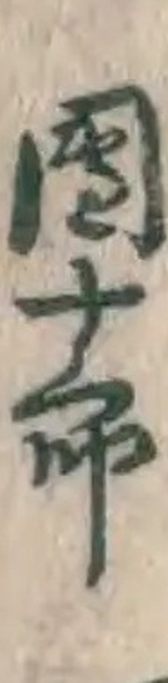団十郎

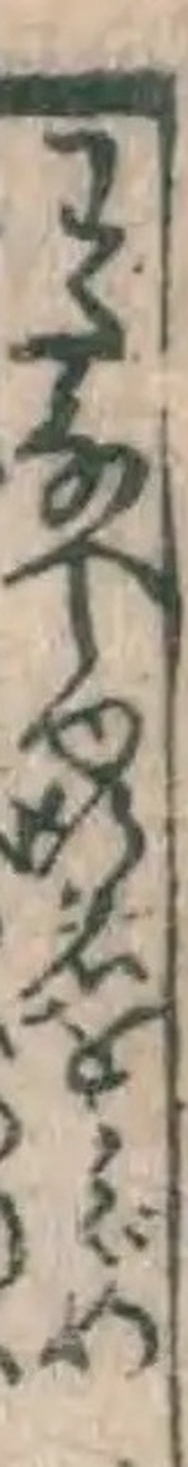わたなへしゆ行者をとゞめ
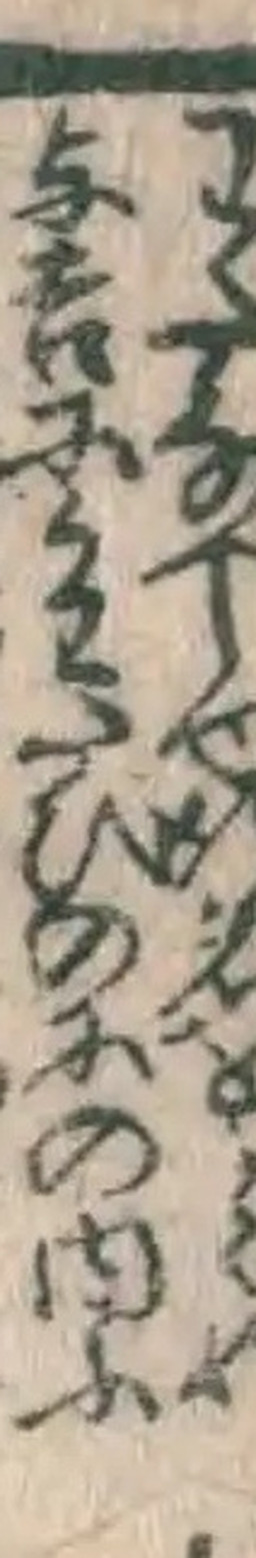与吉にかわたひのにの内に
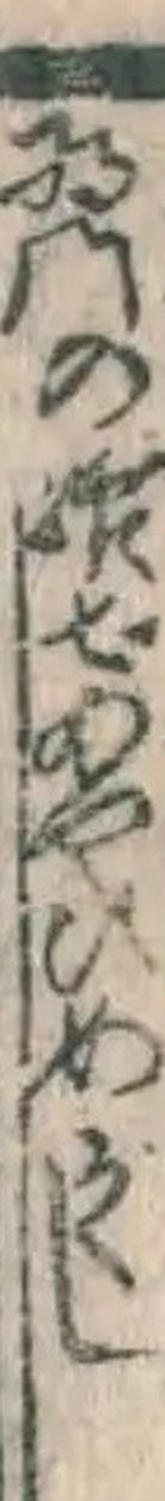将門の娘七あやひめかくし
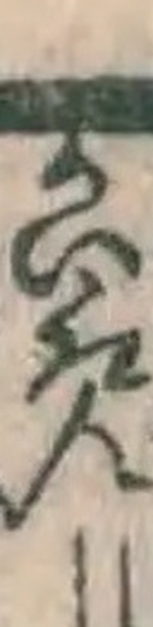かい取ん
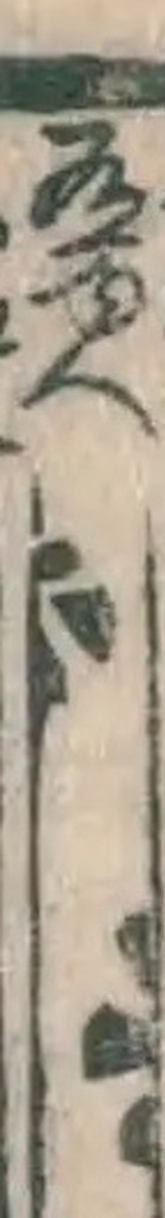有ゆへ
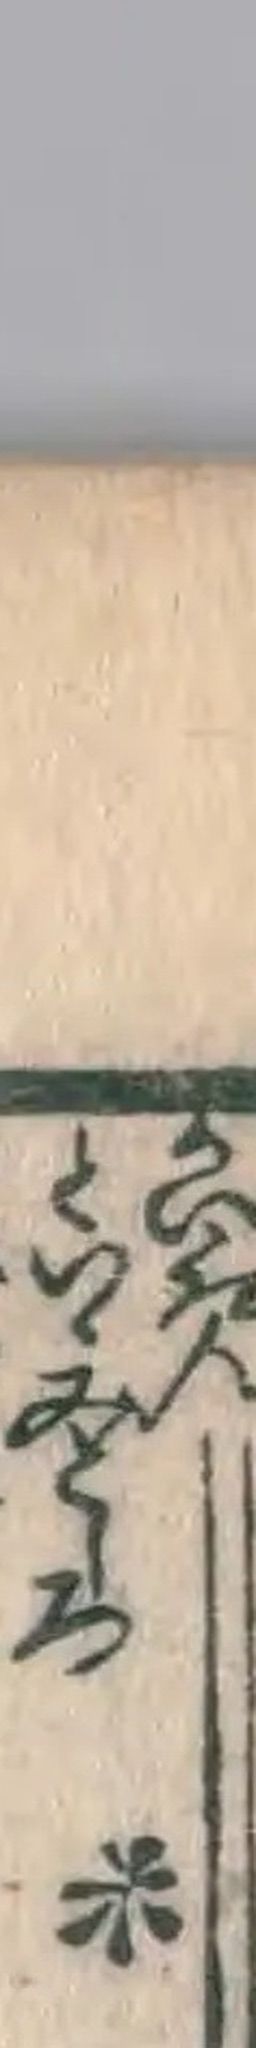といゝみとしろ
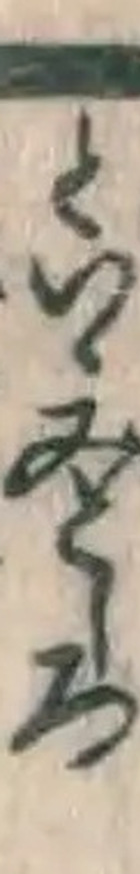といゝみとしろ
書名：四天王宿直着綿
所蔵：国立国会図書館 National Diet Library, JAPAN
